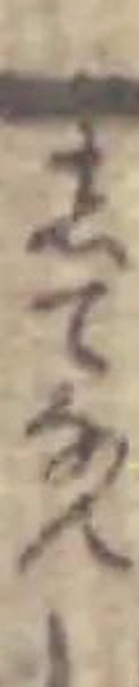してなん
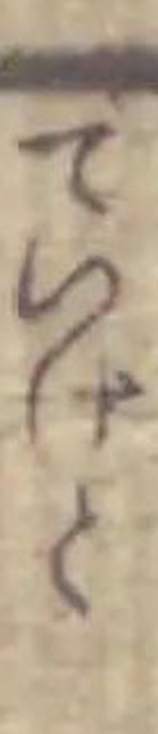ていけと
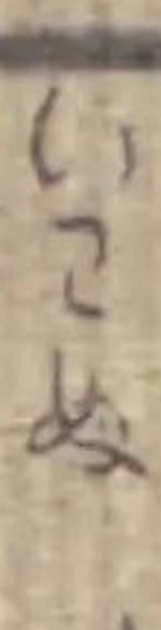いわぬ
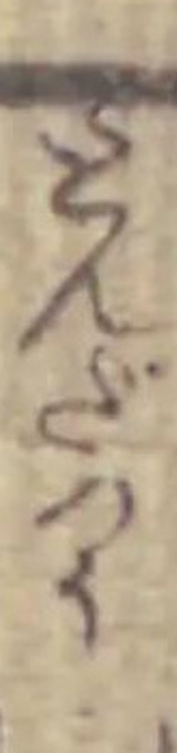とんだつう
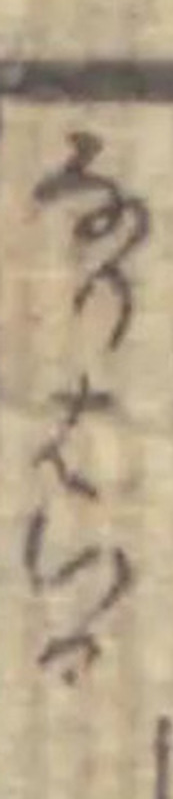なりはいる
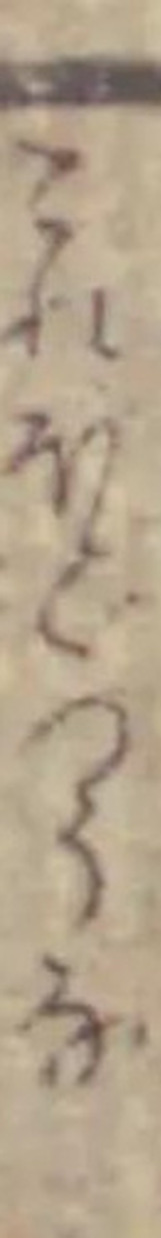これほどつうな
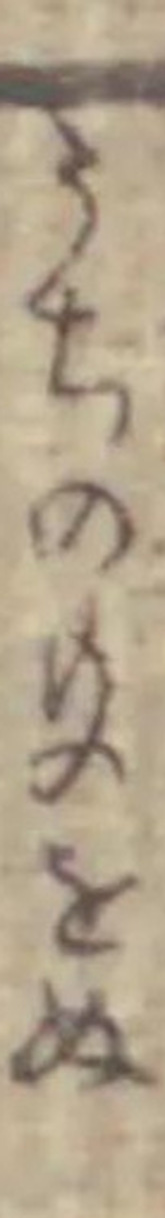うちのものをぬ
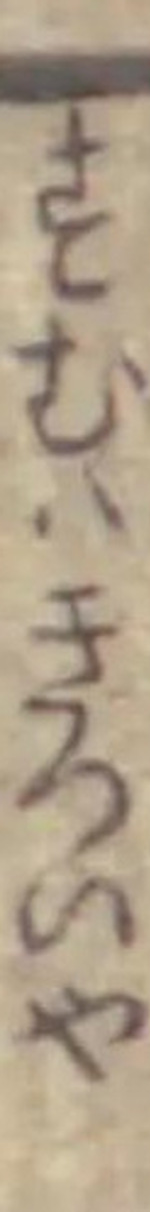すむはきついや
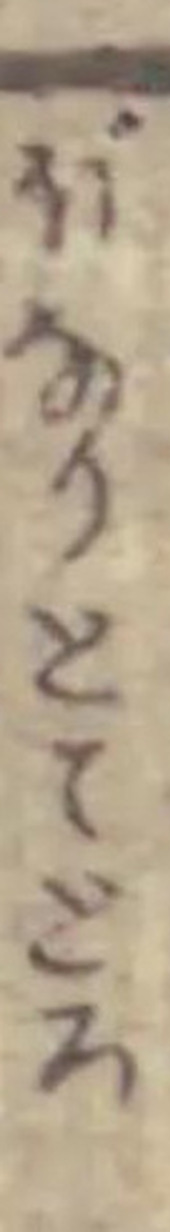ぼなりとてとろ
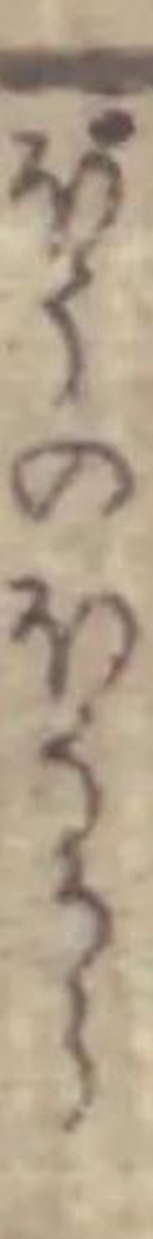ぼうのほうから
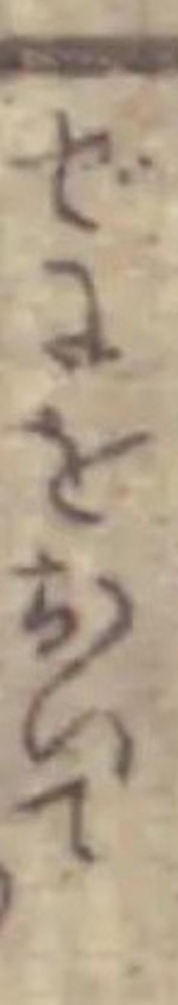ぜにをおいて
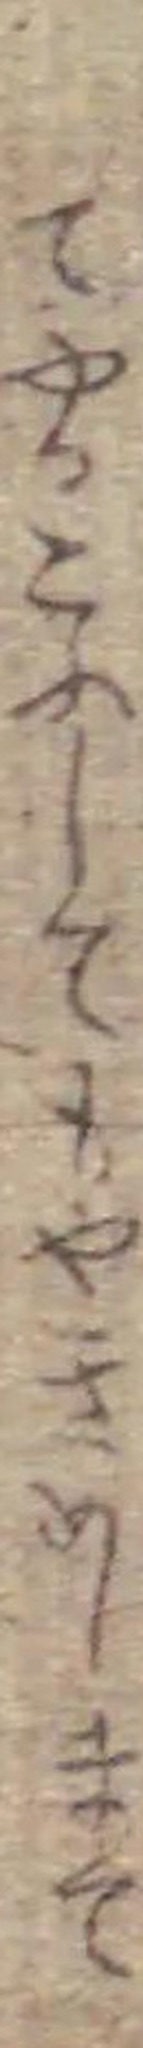てやるこふしてもやきめしまて
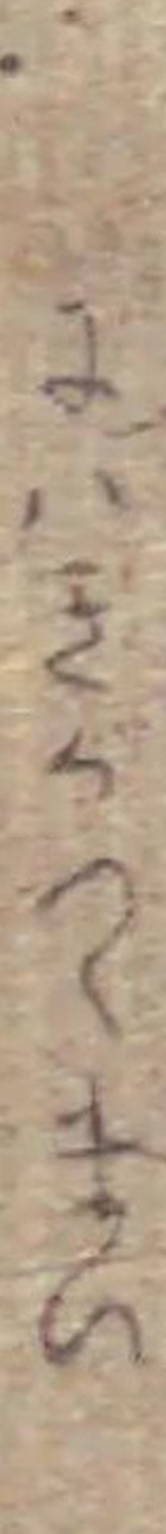にはきがつくまい

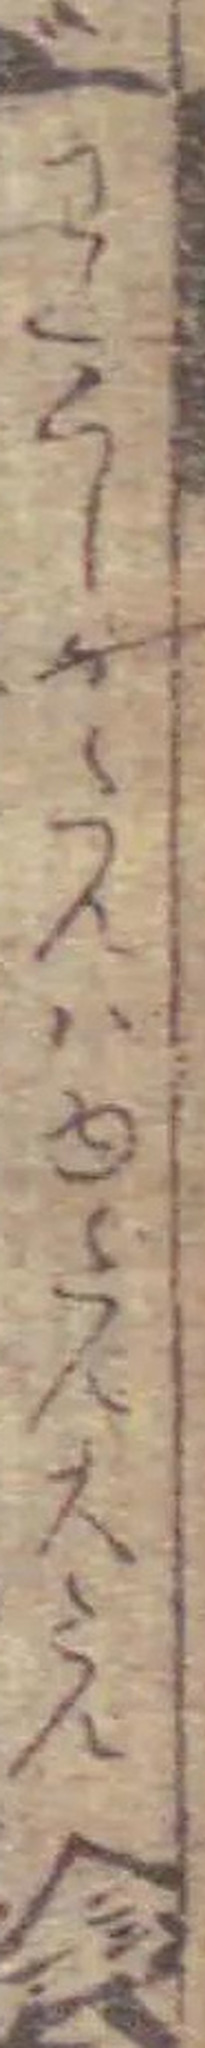わたくしがたんはゆたん大たん
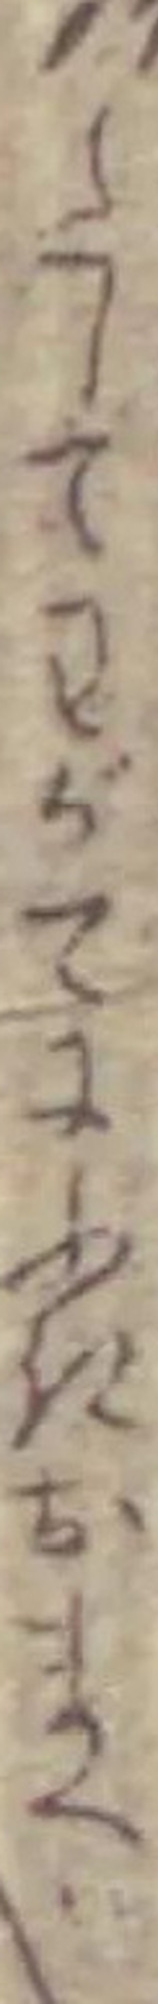たしてわがてにふきおまへは
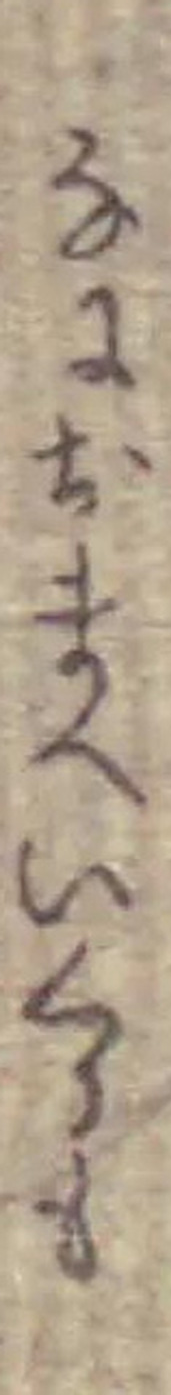なにおまへいくらも
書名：茶羅毛通人 3巻
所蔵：国立国会図書館 National Diet Library, JAPAN
